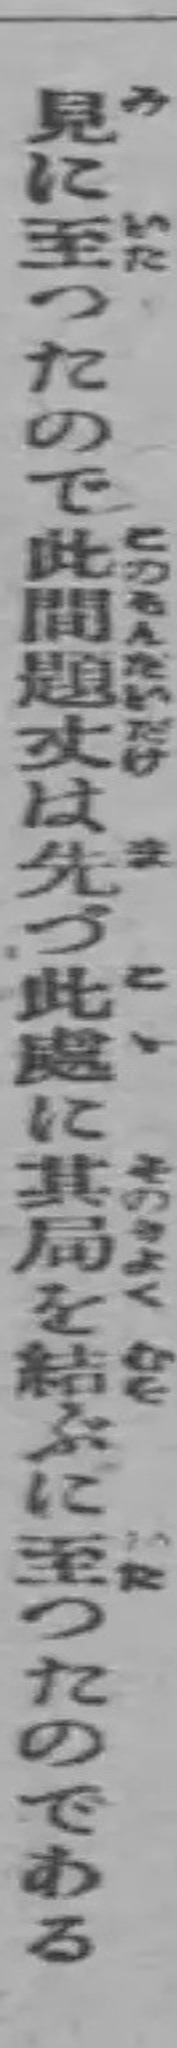見に至つたので此問題丈は先づ此処に其局を結ぶに至つたのである
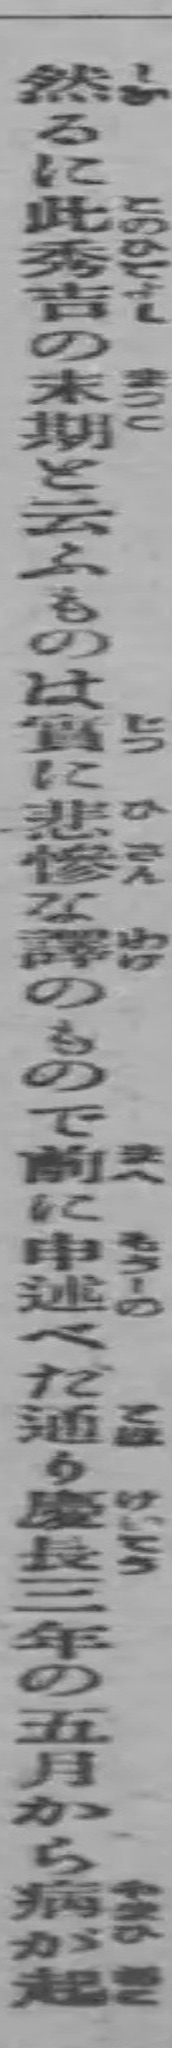然るに此秀吉の末期と云ふものは実に悲惨な訳のもので前にも申述べた通り慶長三年の五月から病が起
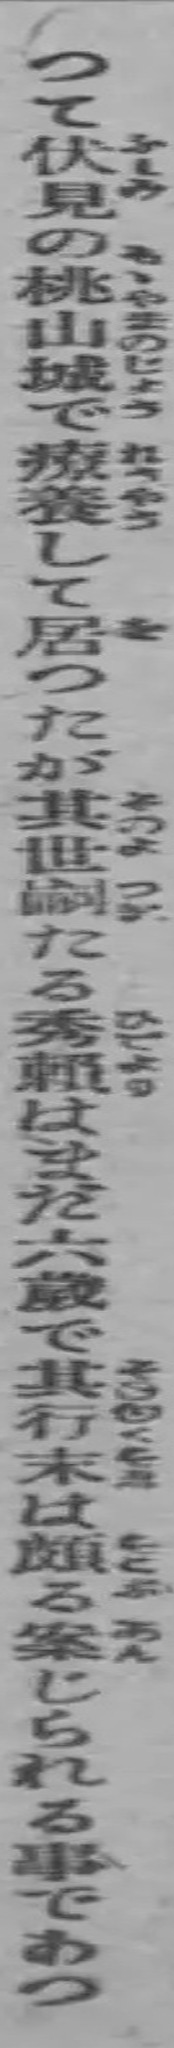つて伏見の桃山城で療養して居つたが其世嗣たる秀頼はまだ六歳で其行末は頗る案じられる事であつ
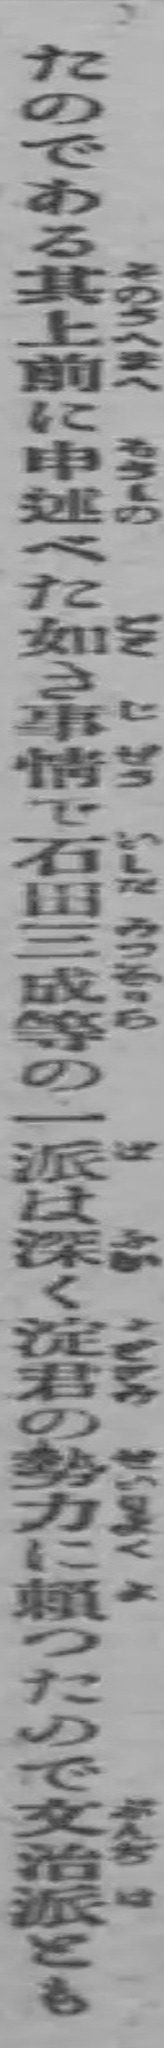たのである其上前に申述べた如き事情で石田三成等の一派は深く淀君の勢力に頼つたので文治派とも
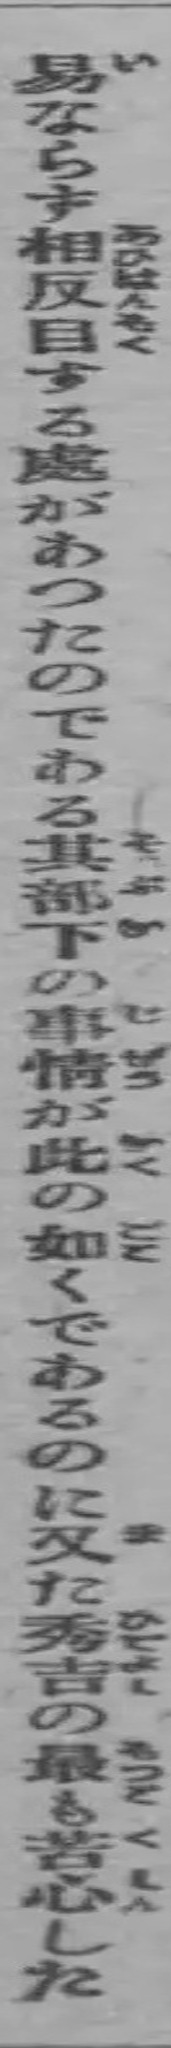易ならず相反目する処があつたのである其部下の事情が此の如くであるのに又た秀吉の最も苦心した
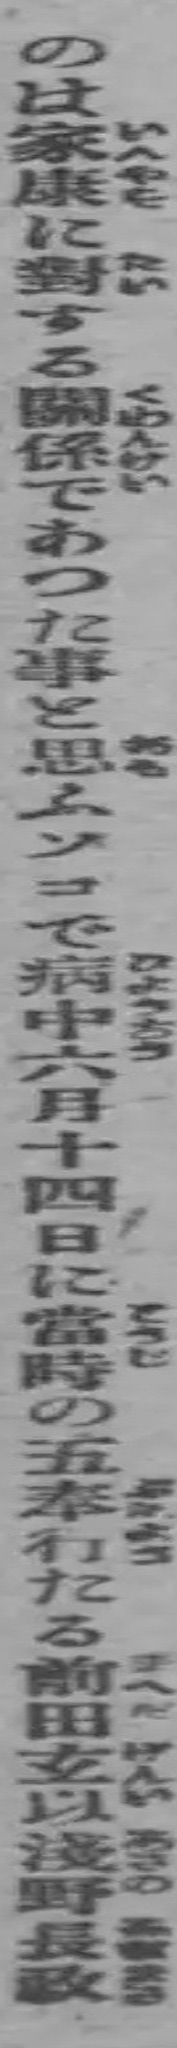のは家康に対する関係であつた事と思ふソコで病中六月十四日に当時の五奉行たる前田玄以浅野長政

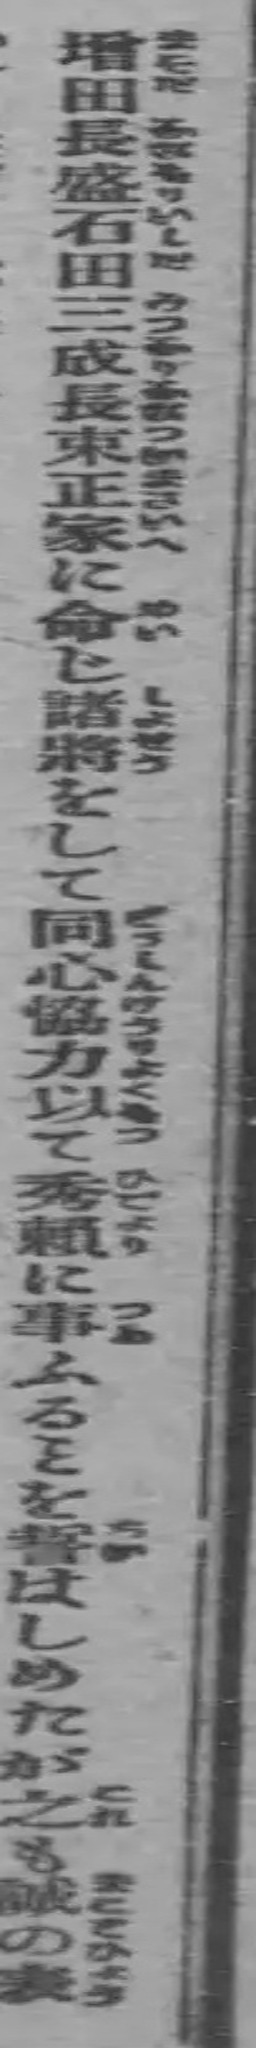増田長盛石田三成長束正家に命じ諸将をして同心協力以て秀頼に事ふることを誓はしめたが之も誠の表
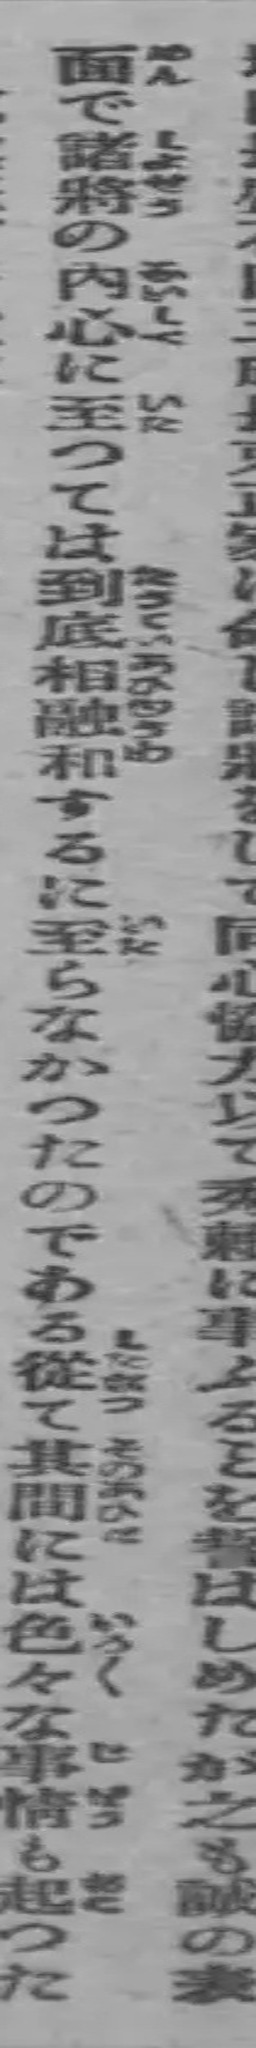面で諸将の内心に至つては到底相融和するに至らなかつたのである従て其間には色々な事情も起つた
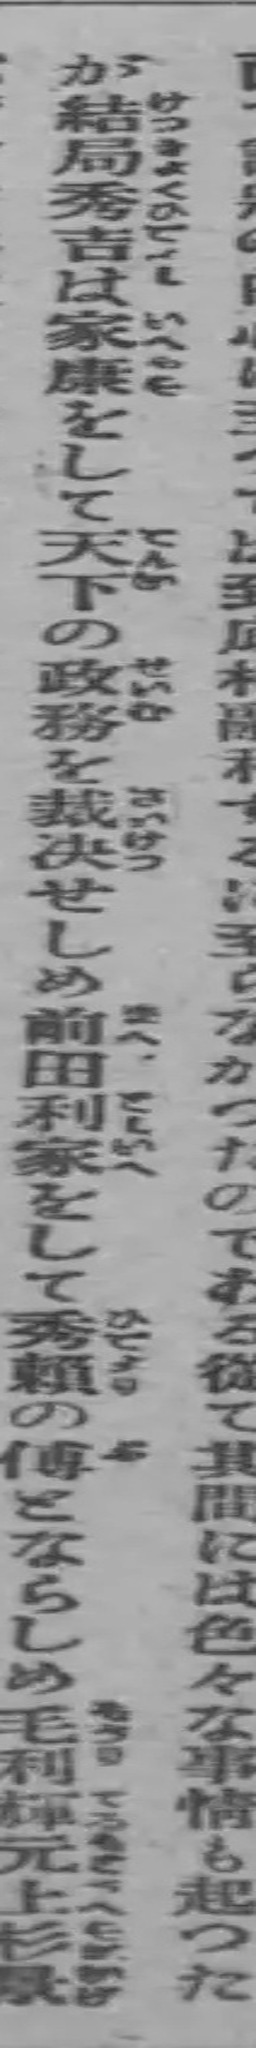が結局秀吉は家康をして天下の政務を裁決せしめ前田利家をして秀頼の傅とならしめ毛利輝元上杉景
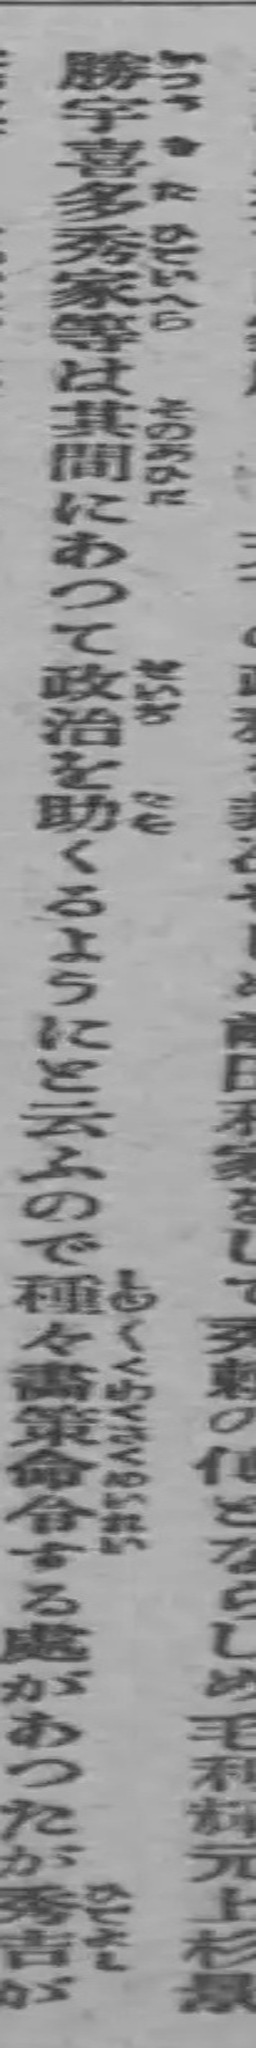勝宇喜多秀家等は其間にあつて政治を助くるようにと云ふので種々画策命令する処があつたが秀吉が
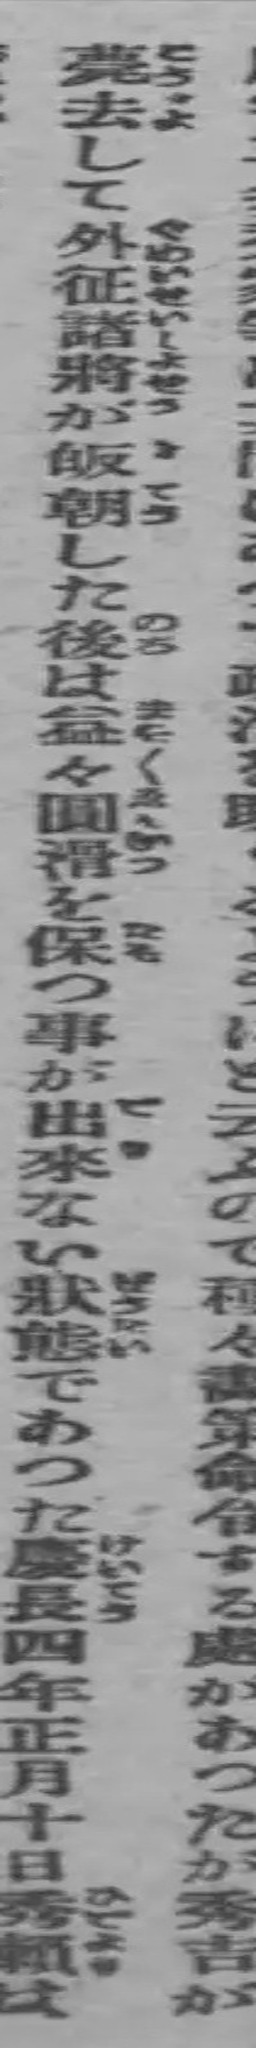薨去して外征諸将が皈朝した後は益々円滑を保つ事が出来ない状態であつた慶長四年正月十日秀頼は
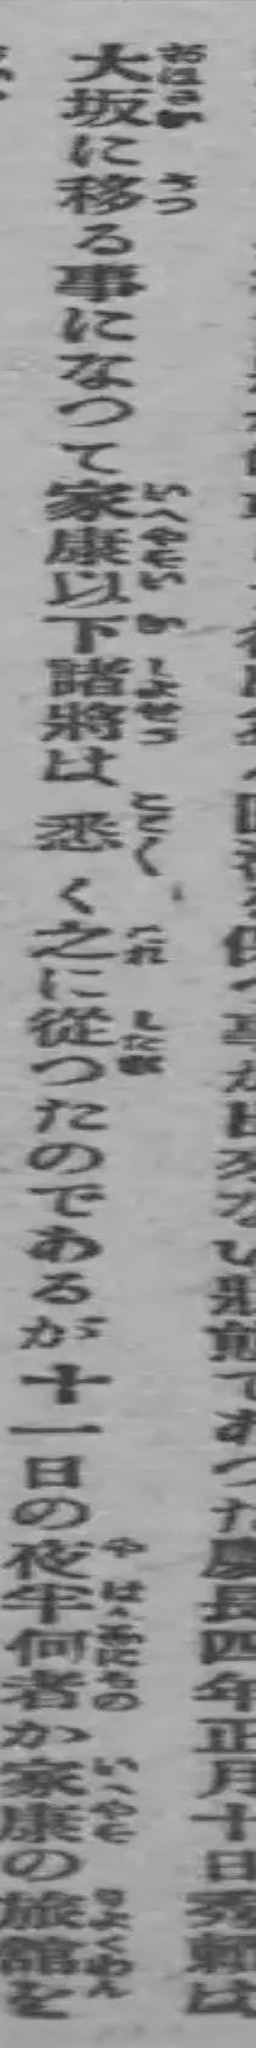大坂に移る事になつて家康以下諸将は悉く之に従つたのであるが十一日の夜半何者か家康の旅舘を
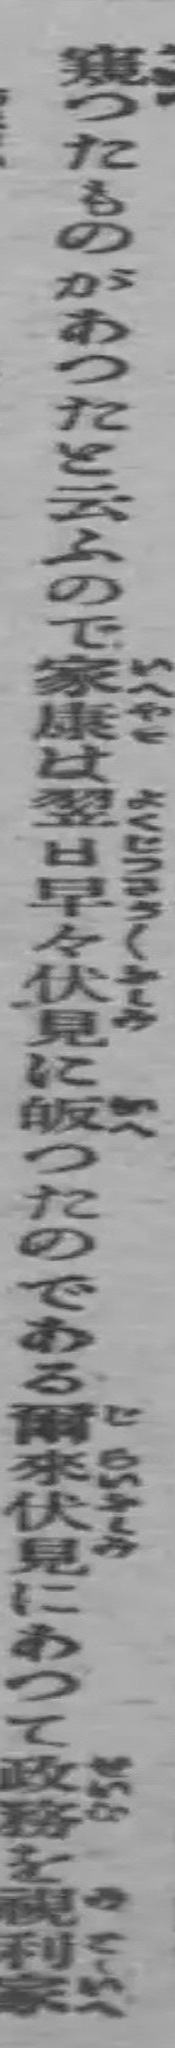窺つたものがあつたと云ふので家康は翌日早々伏見に皈つたのである爾来伏見にあつて政務を視利家
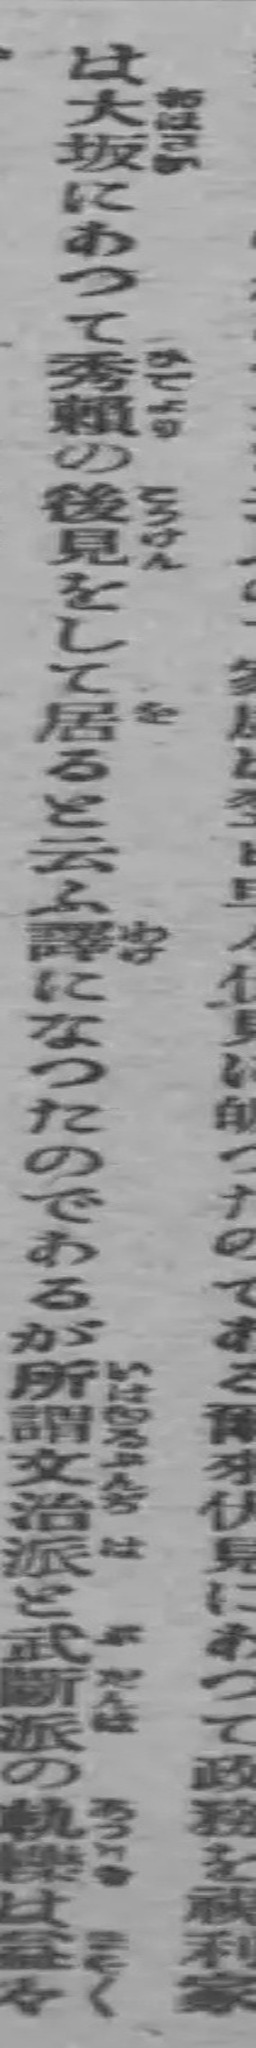は大坂にあつて秀頼の後見をして居ると云ふ訳になつたのであるが所謂文治派と武断派の軌轢は益々
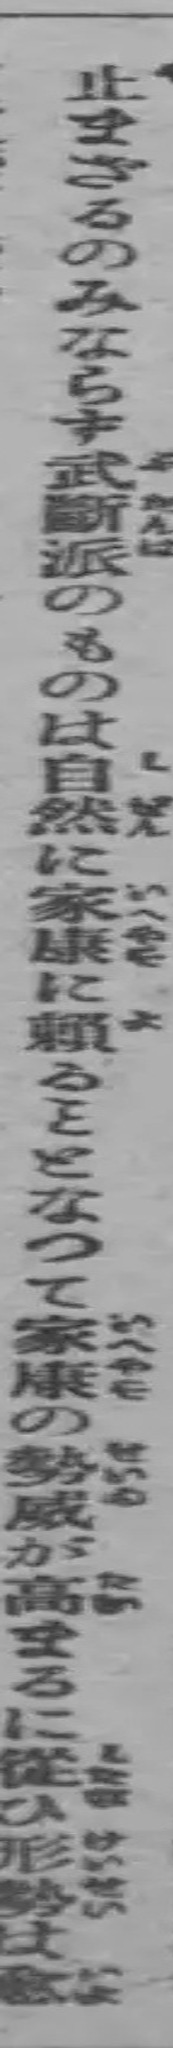止まざるのみならず武断派のものは自然に家康に頼ることとなつて家康の勢威が高まるに従ひ形勢は愈
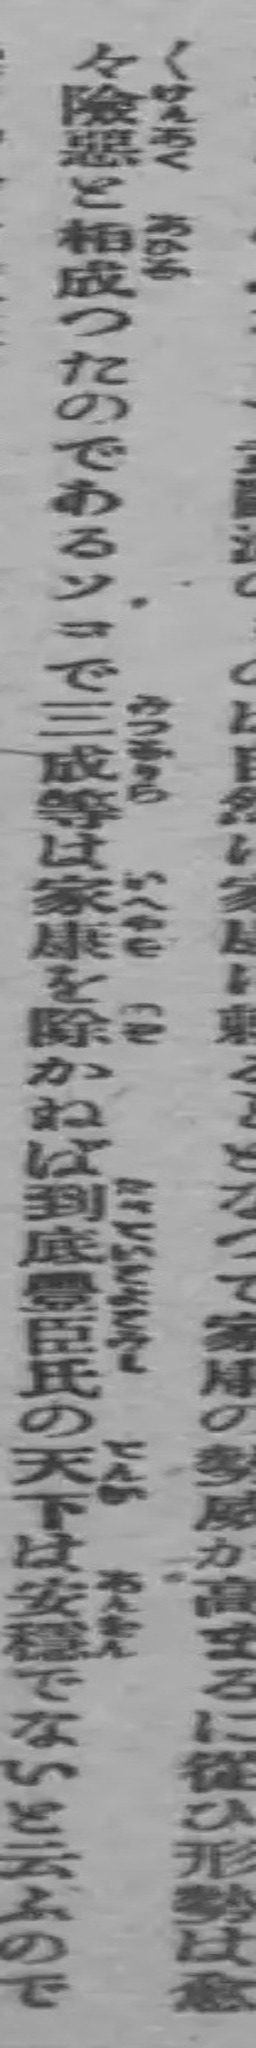愈険悪と相成つたのであるソコで三成等は家康を除かねば到底豊臣氏の天下は安穏でないと云ふので
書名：豊橋市史談
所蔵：国立国会図書館 National Diet Library, JAPAN
